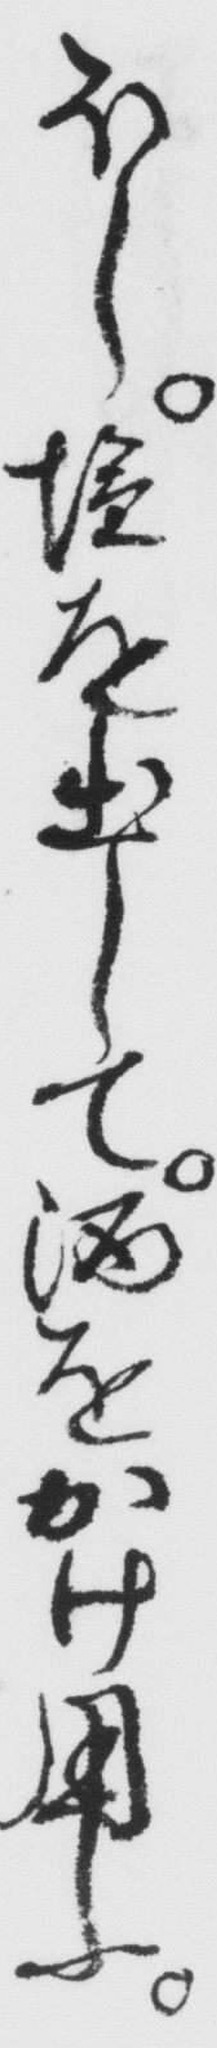ほし。塩を出して。酒をかけ用ふ。
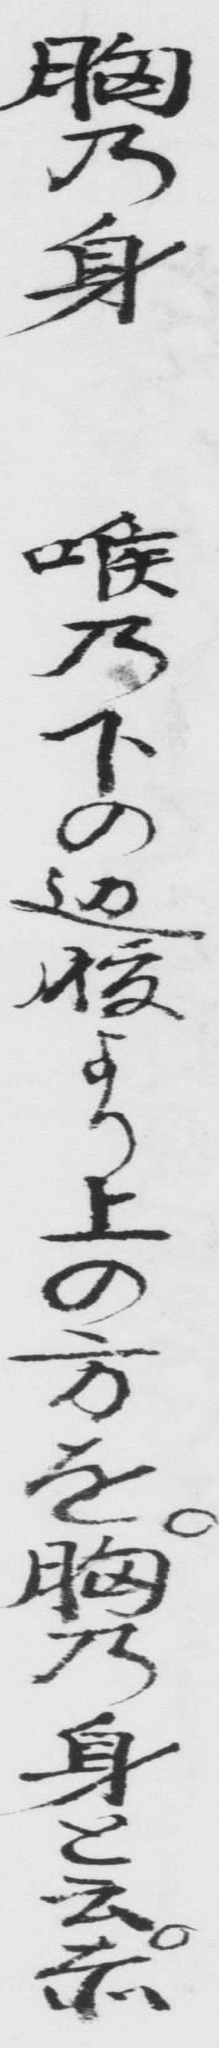胸の身喉の下の辺腹より上の方を。胸の身と云。赤
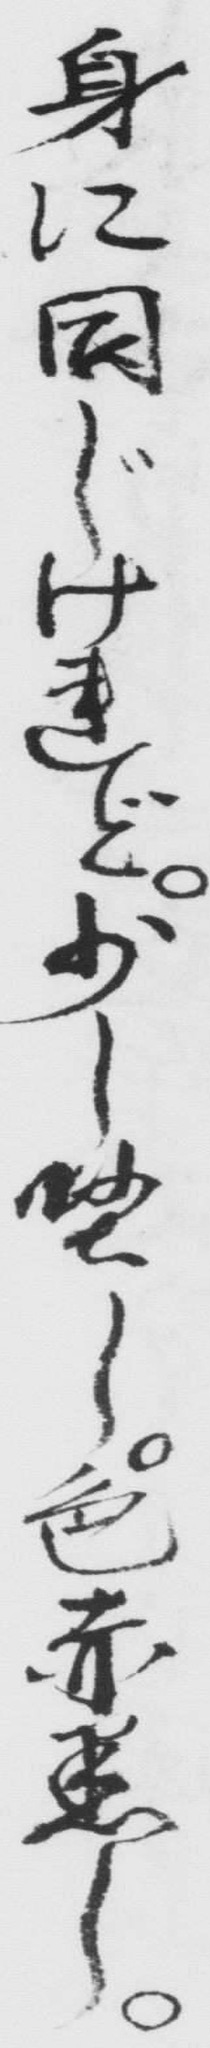身に同じけれど。少し堅し。色赤黒し。
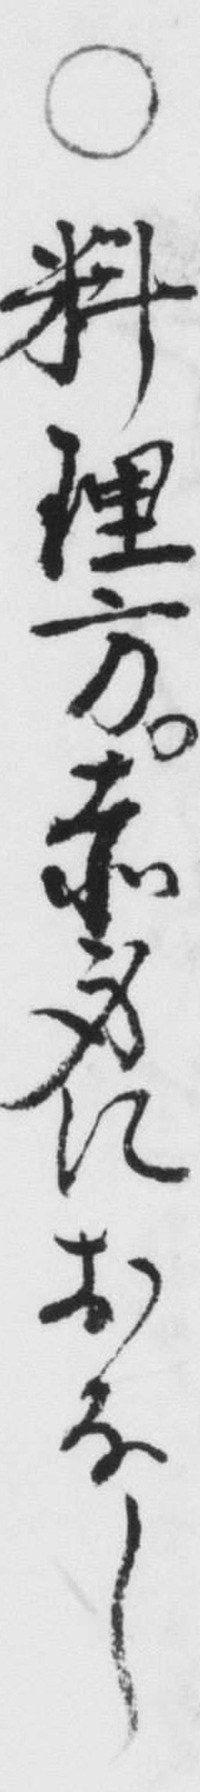○料理方。赤身におなし
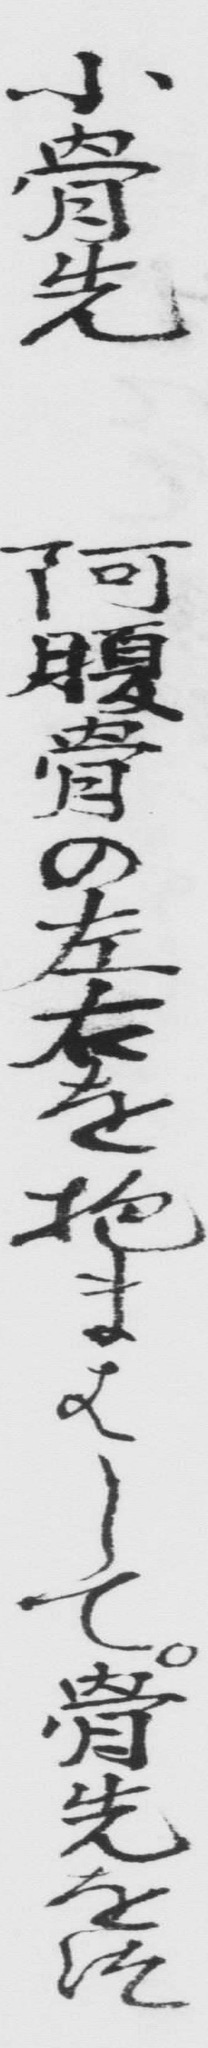小骨先阿腹骨の左右を抱まはして。骨先をつ
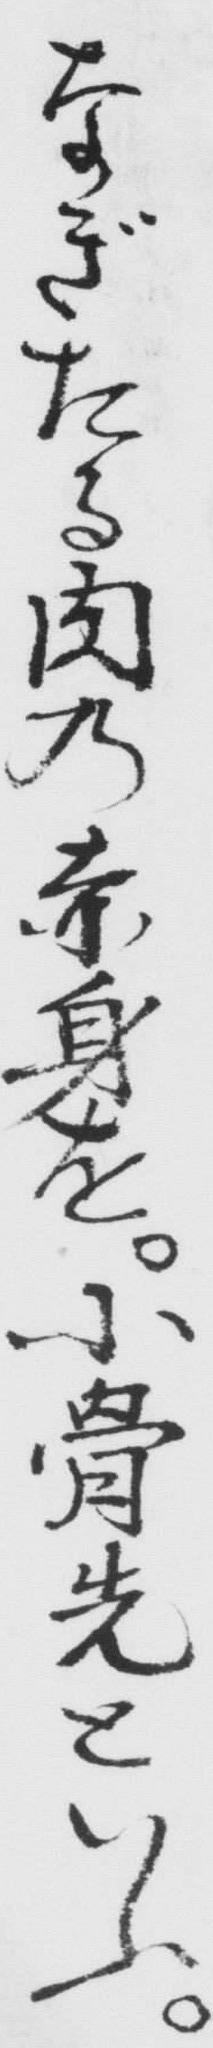なぎたる肉の赤身を。小骨先といふ。

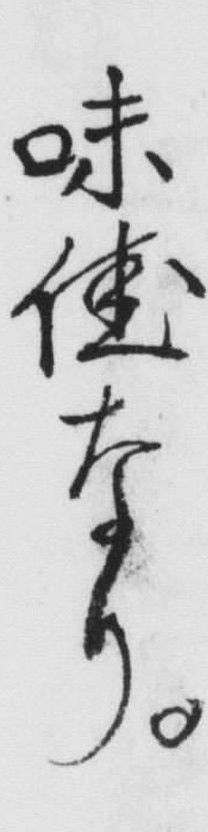味佳なり。
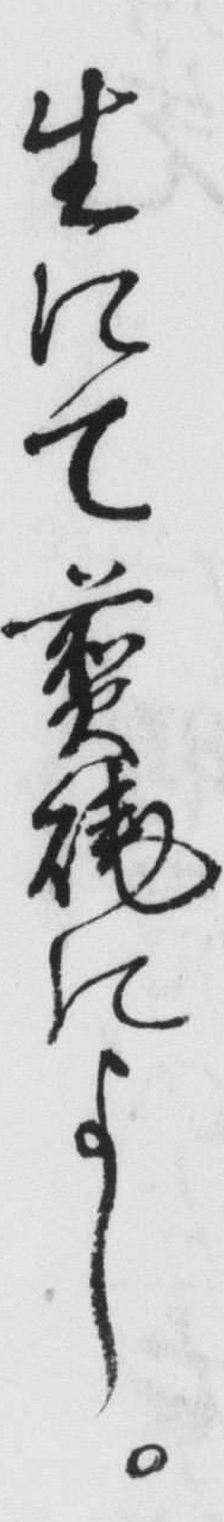○生にて煎焼によし。
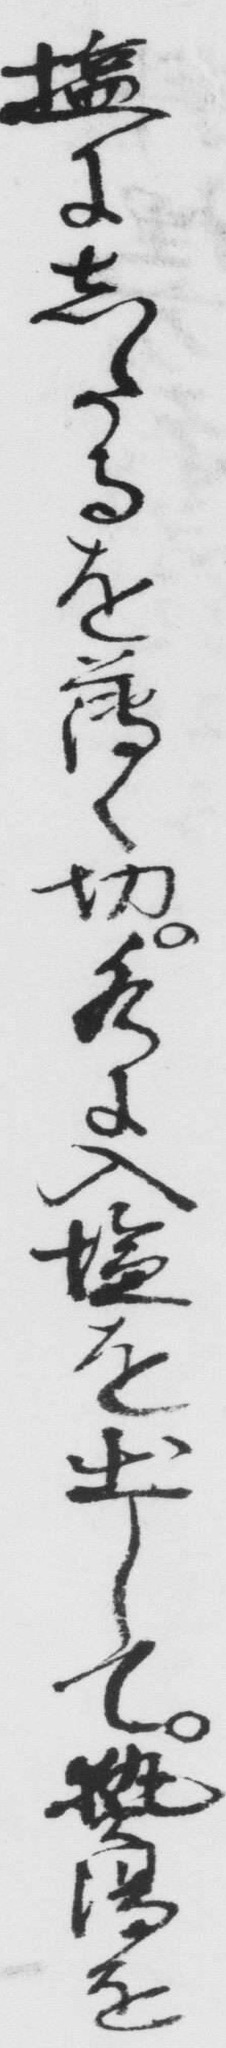○塩にしたるを薄く切。水に入塩を出して。熱湯を
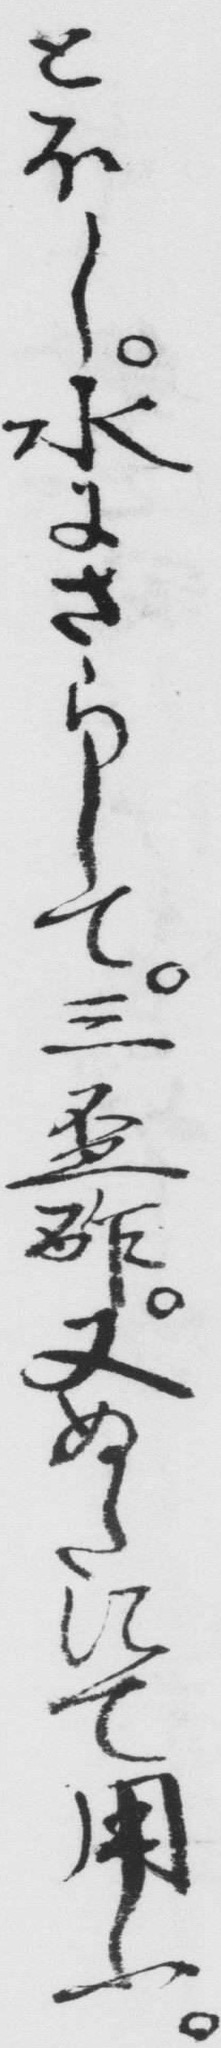とほし。水にさらして。三盃酢。又ぬたにして用ふ。
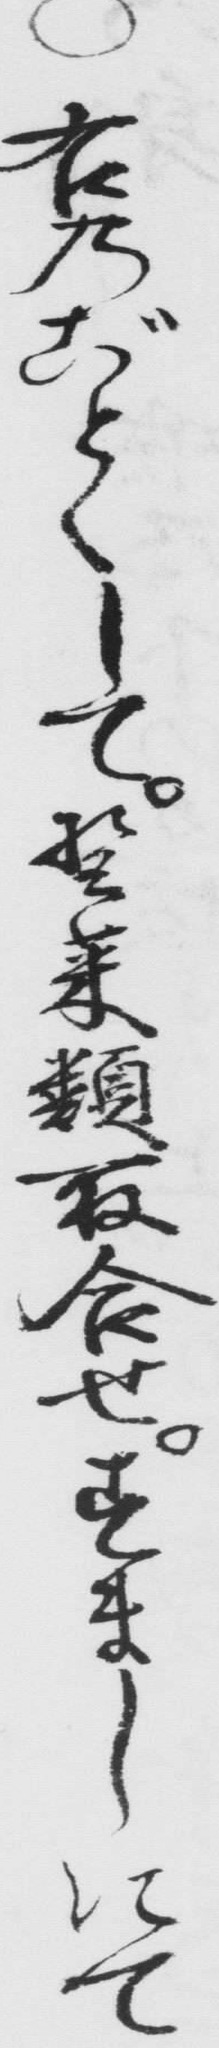○右のごとくして。野菜類取合せ。すましにて
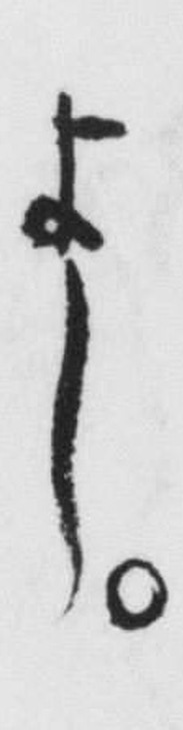よし。
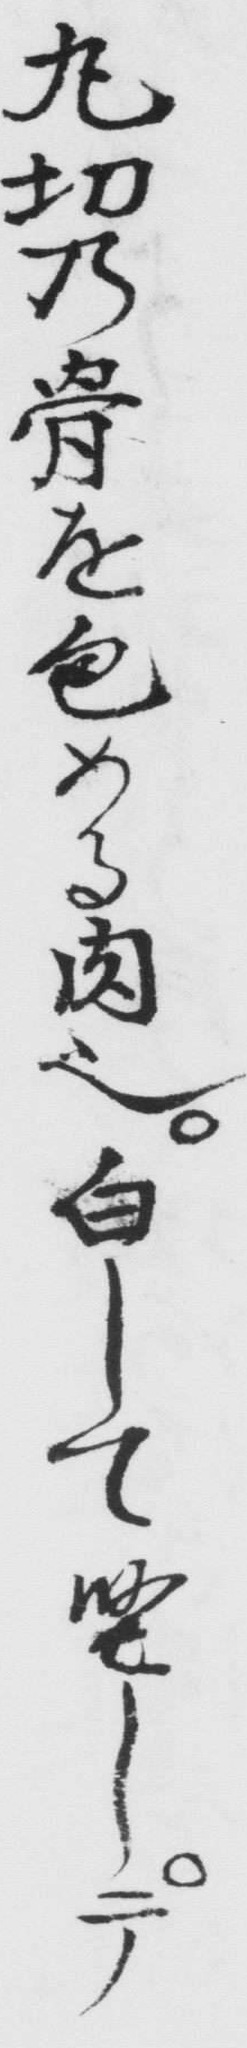廻し丸切の骨を包める肉也。白して堅し。テ
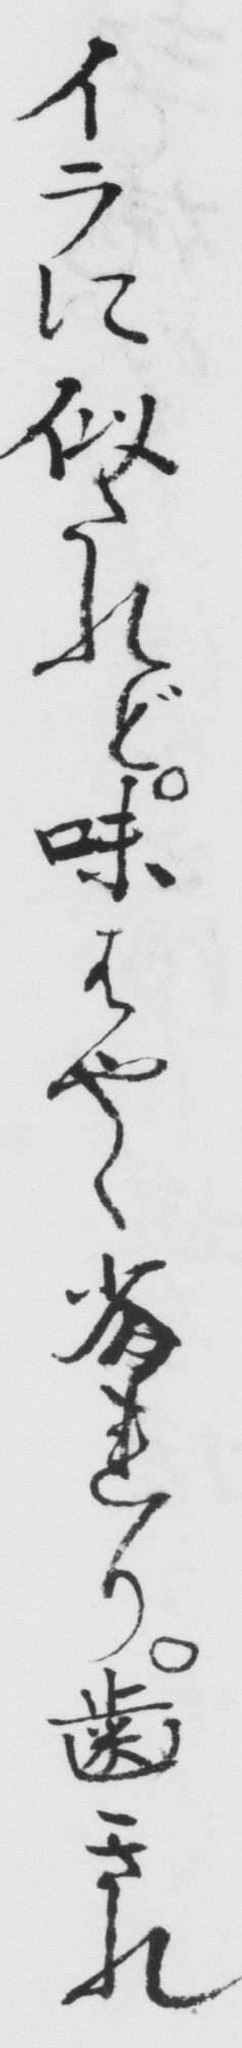イラに似たれど。味はやく劣れり。歯きれ
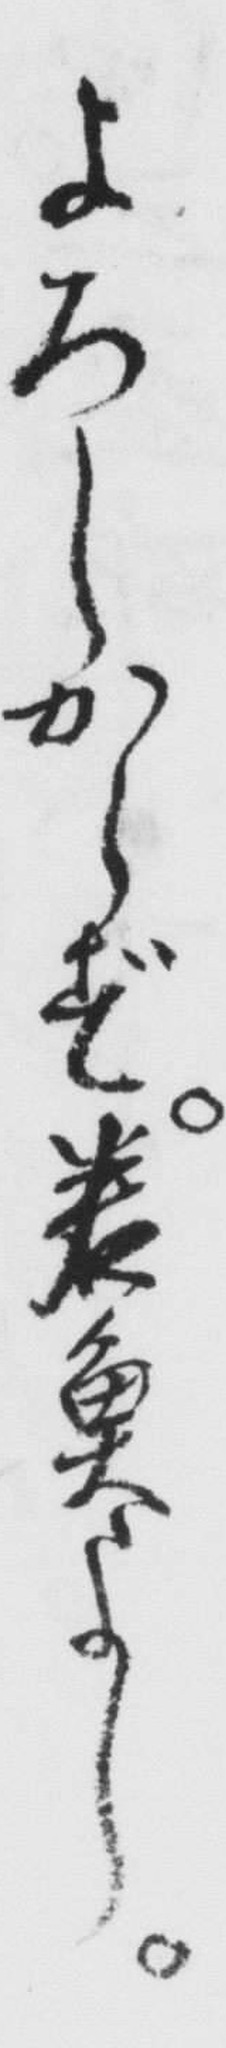よろしからず。若魚よし。
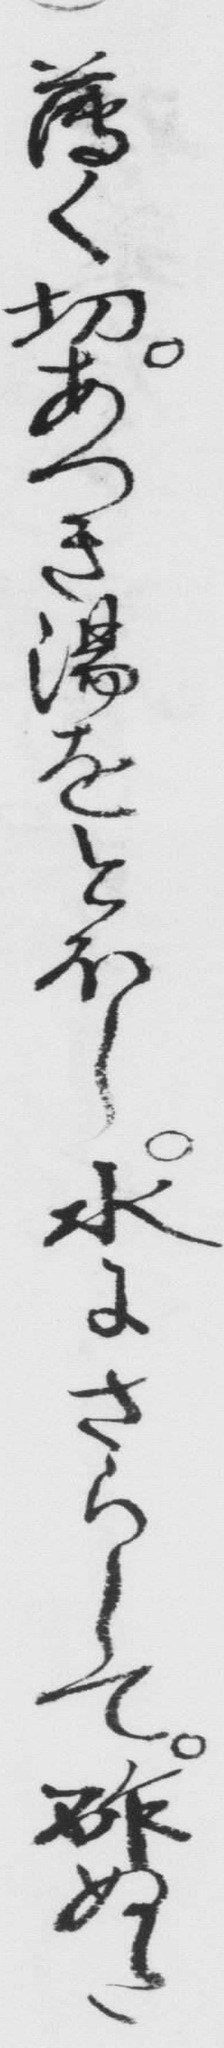○薄く切。あつき湯をとほし。水にさらして。酢ぬた
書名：鯨肉調味方
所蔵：大阪府立大学学術情報センター 国文学研究資料館
